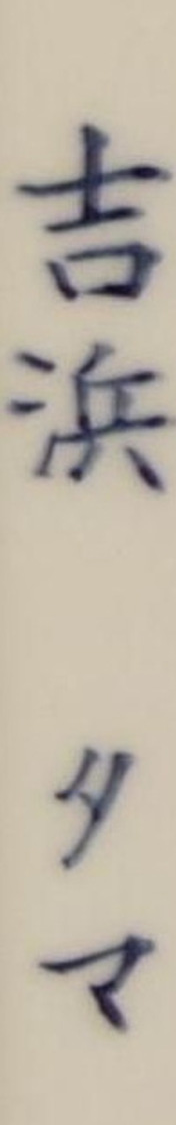吉兵タマ

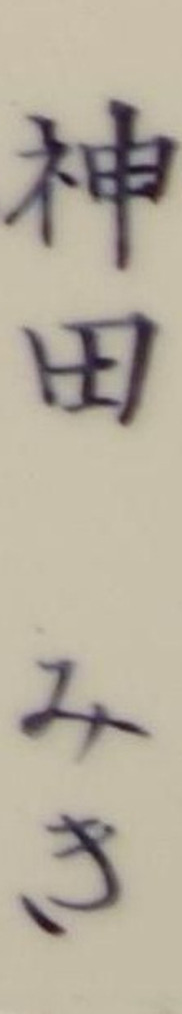神田みき
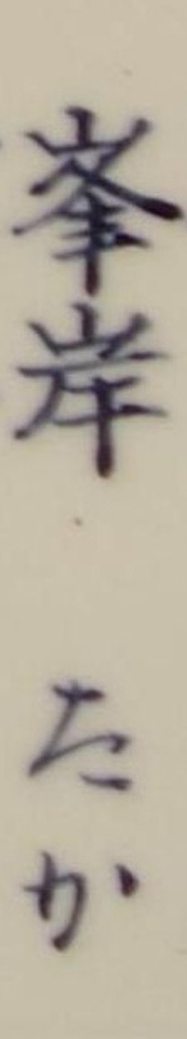峯岸たか
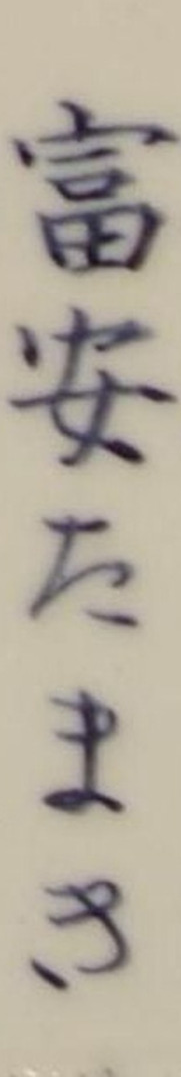富安たまき
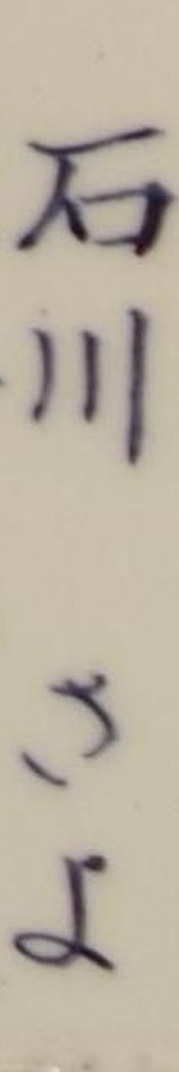石川さよ
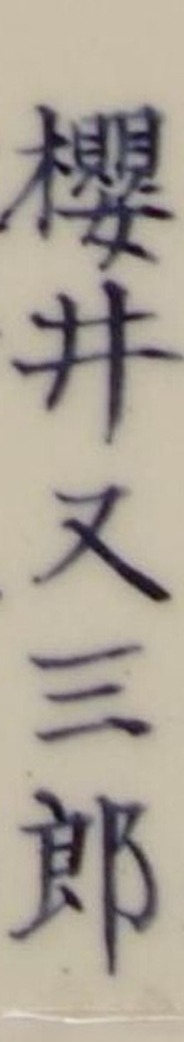桜井又三郎
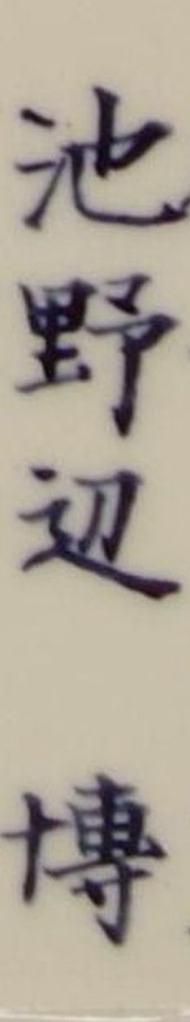池野辺博
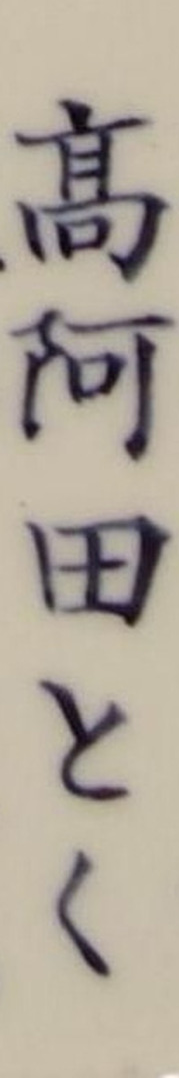高阿田とく
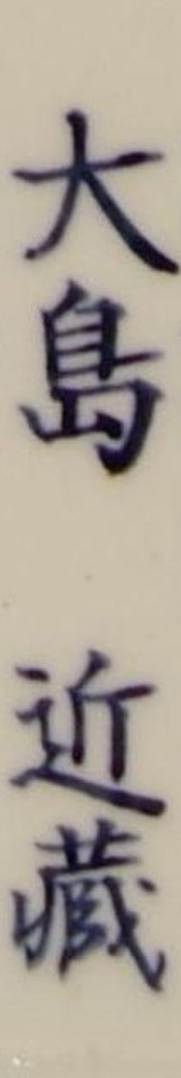大島近蔵
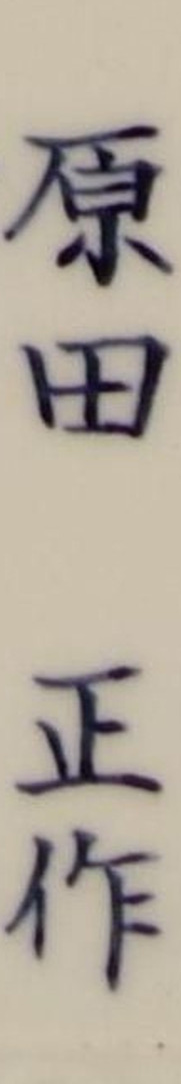原田正作
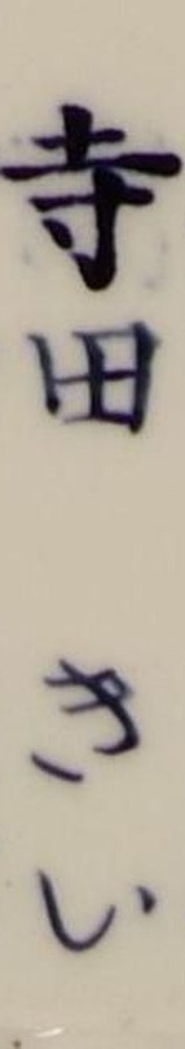寺田きい
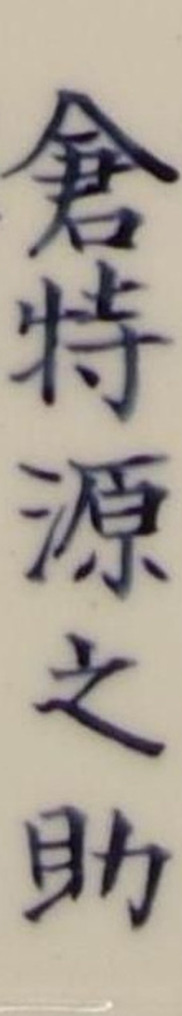倉特源之助
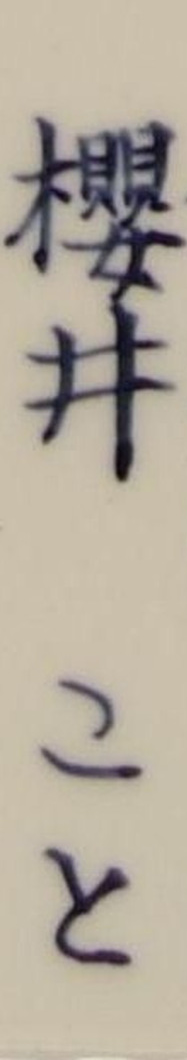桜井こと
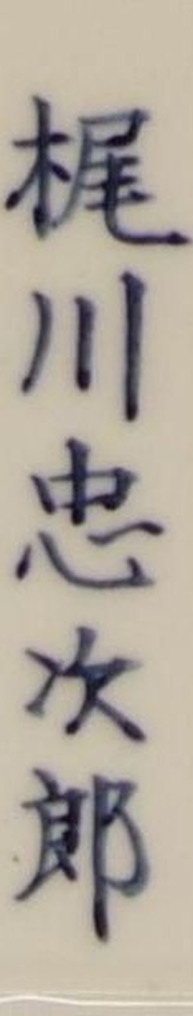梶川忠次郎
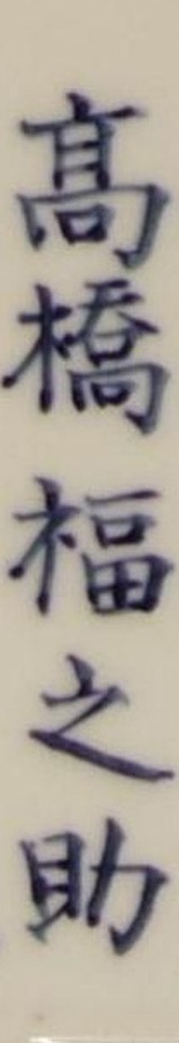高橋福之助
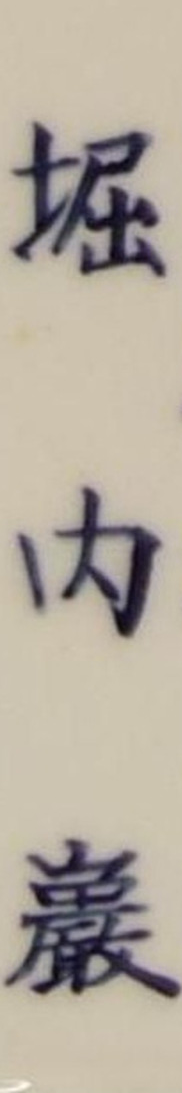堀内巌
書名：M~S
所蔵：高野山金剛峯寺
